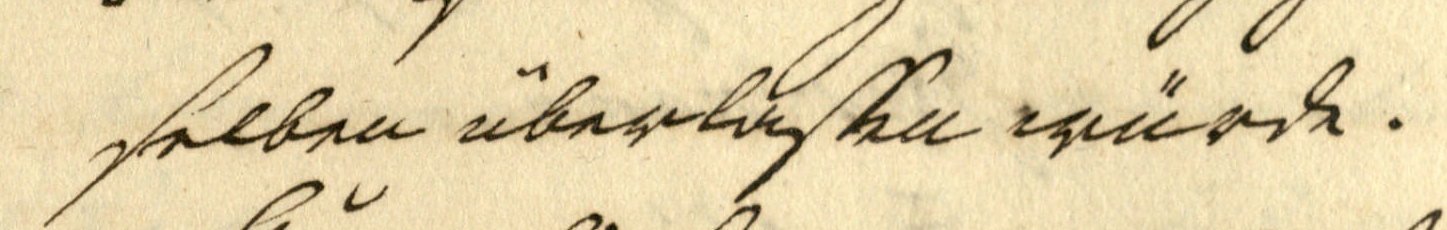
selben überlassen würde.
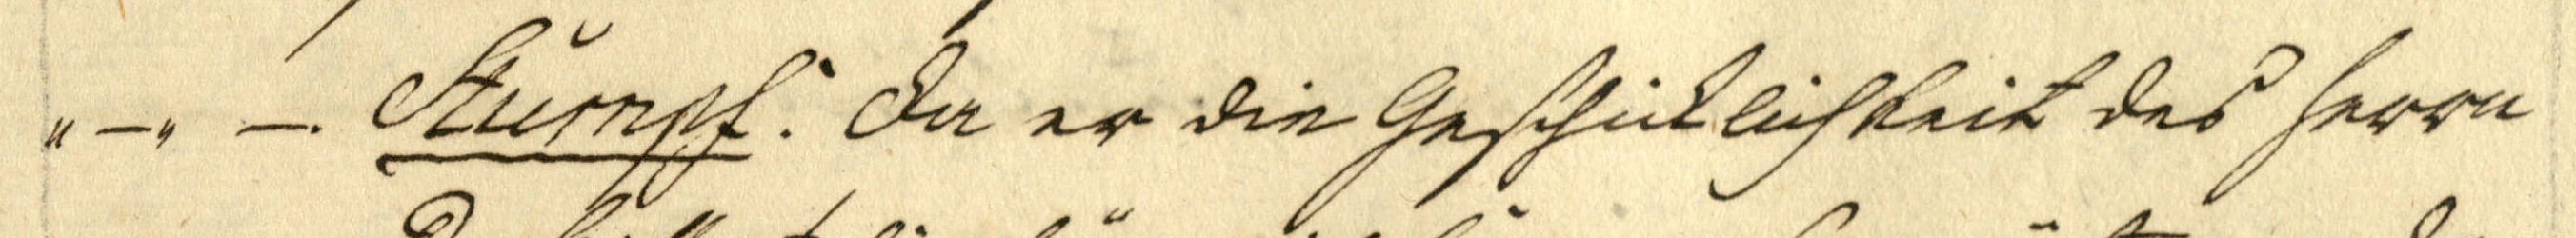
" - " - . Stumpf. Da er die Geschicklichkeit des herrn
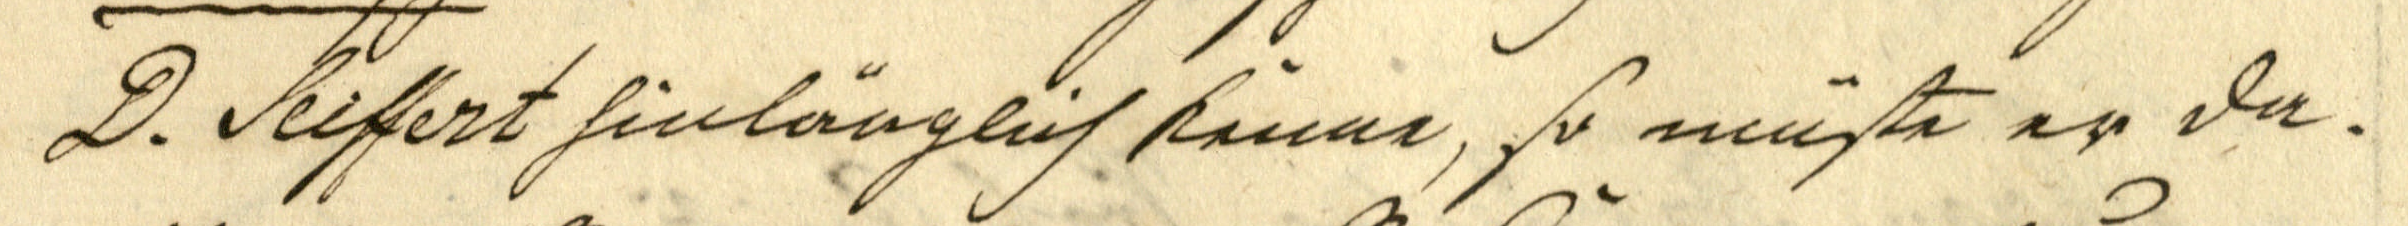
D. Seiffert hinlänglich kenne, so müste er da-
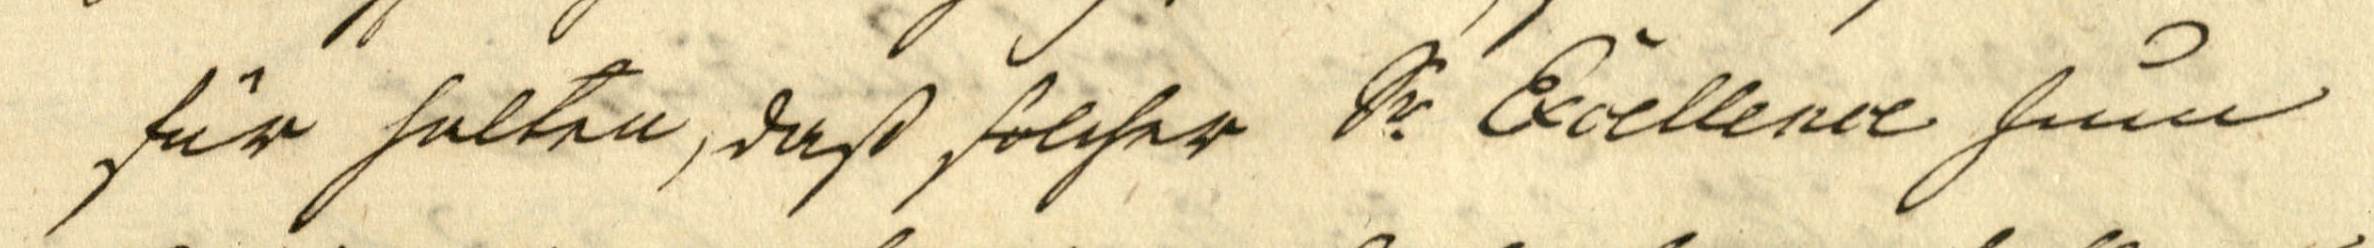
für halten, daß solcher Sr. Excellence zum
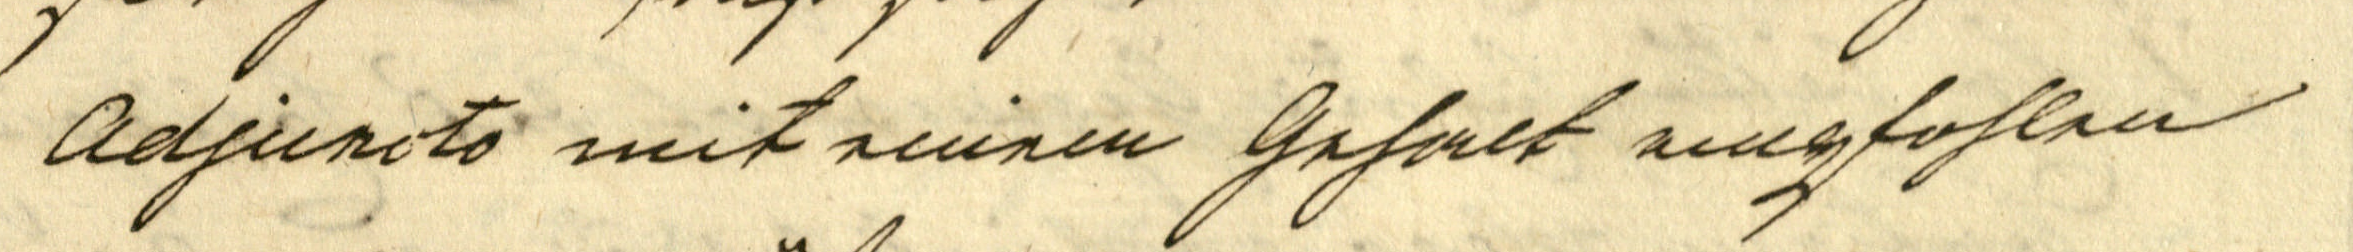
Adjuncto mit einem Gehalt empfohlen
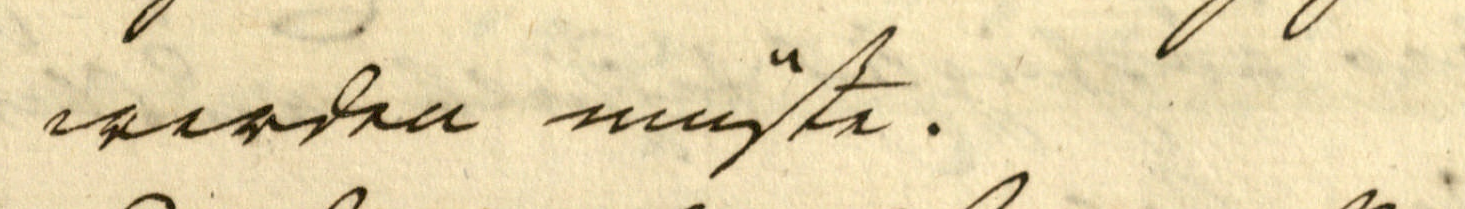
werden müßte.
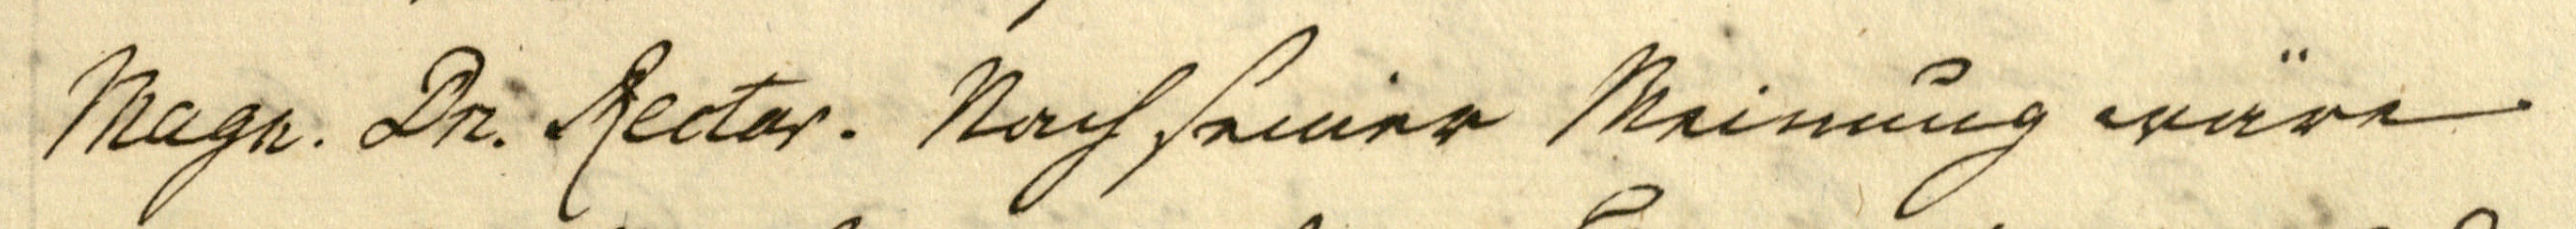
Magn. Dn. Rector. Nach seiner Meinung wäre
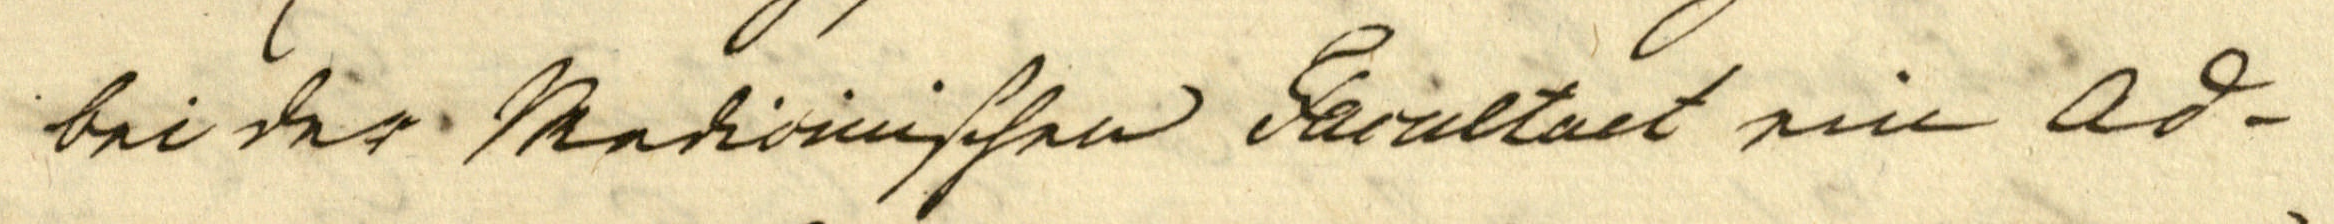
bei der Medicinischen Facultaet ein Ad-
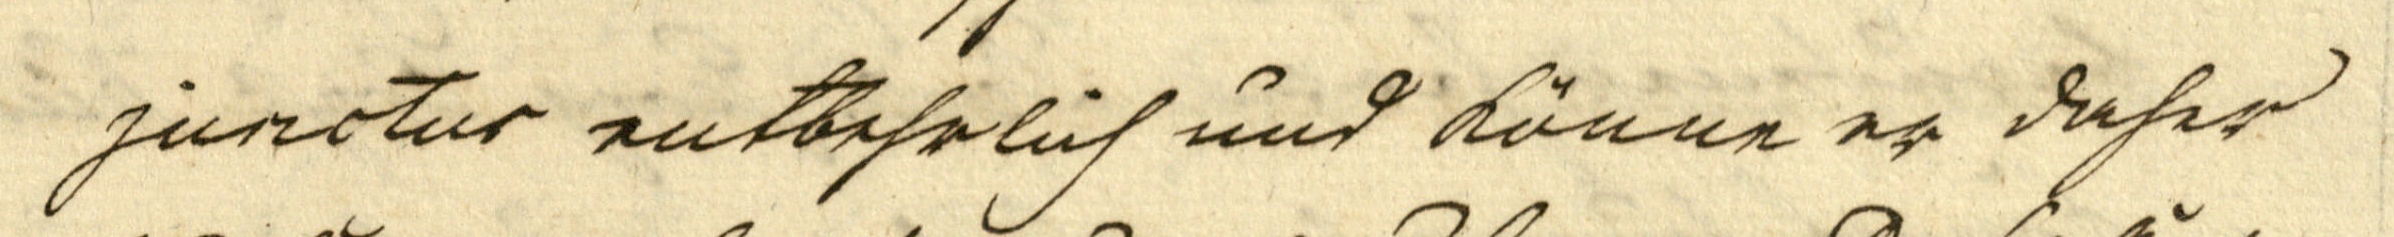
junctus entbehrlich und könne er daher
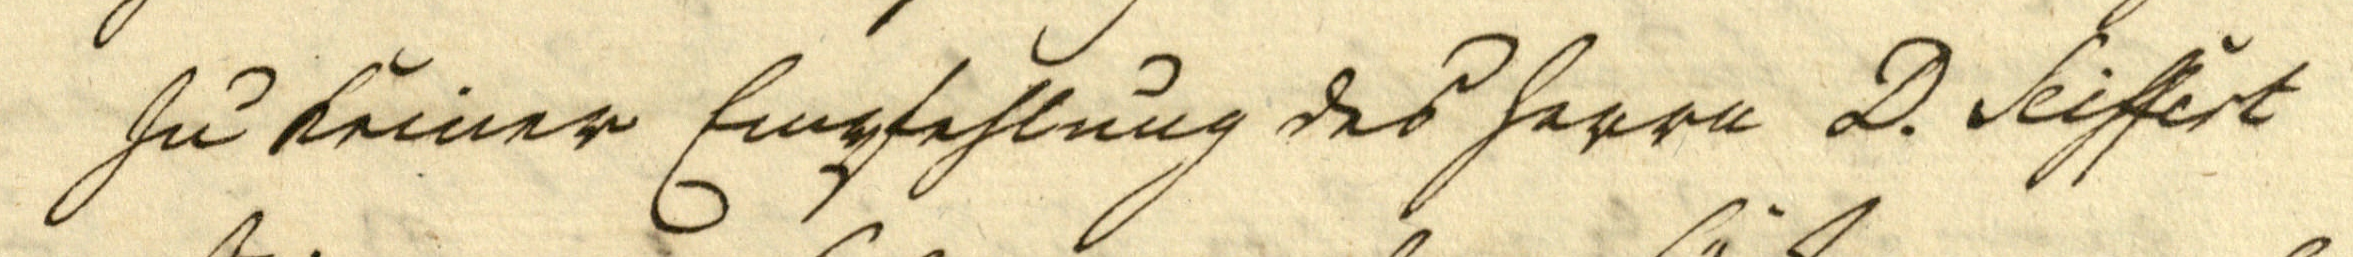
zu keiner Empfehlung des herrn D. Seiffert
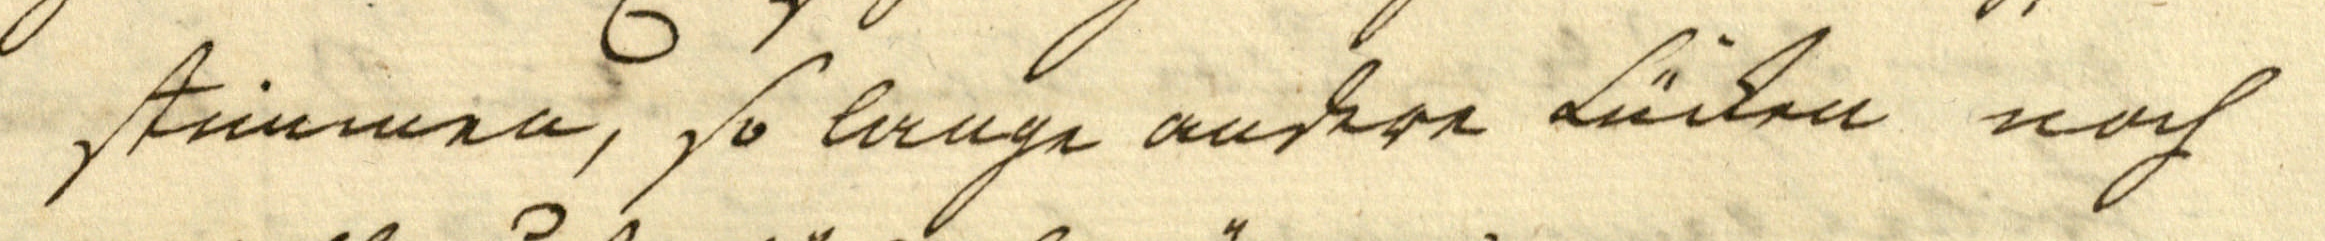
stimmen, so lange andere Lücken noch
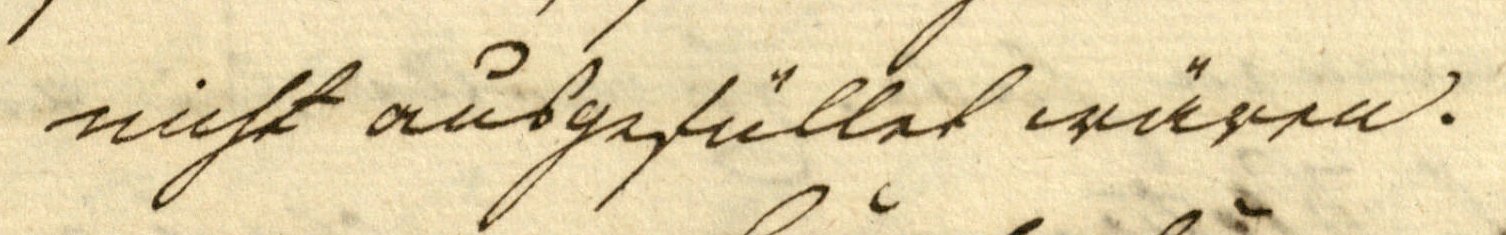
nicht ausgefüllet wären.
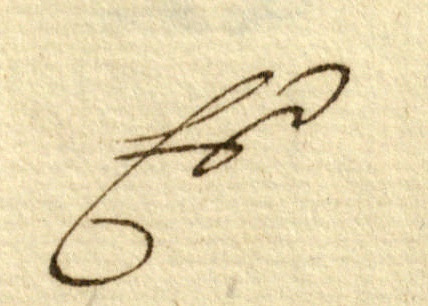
Es
